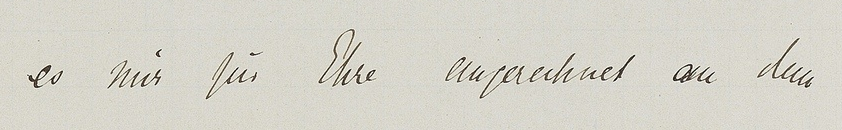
es mir zur Ehre angerechnet an dem
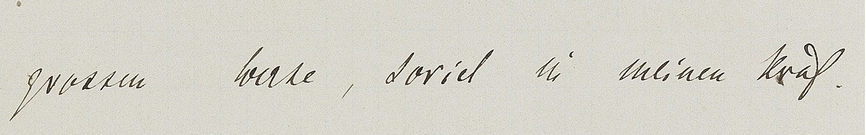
grossen Werke, soviel in meinen Kräf-
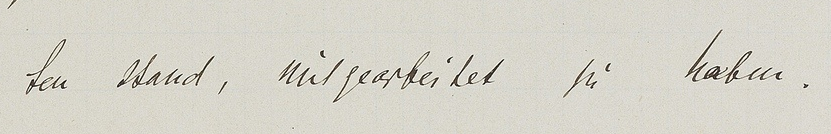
ten stand, mitgearbeitet zu haben.
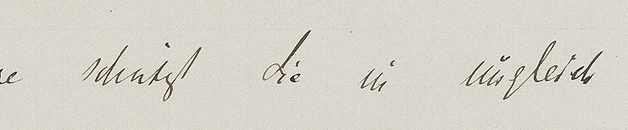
schützt Sie in ungleich
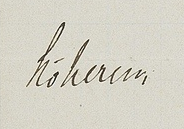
Neid und
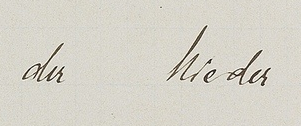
der Nieder-
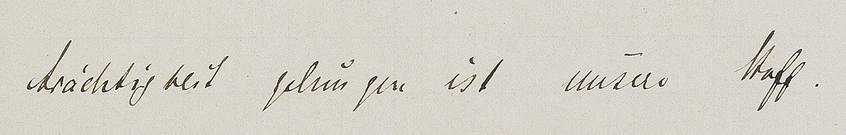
trächtigkeit gelungen ist unsere Hoff-
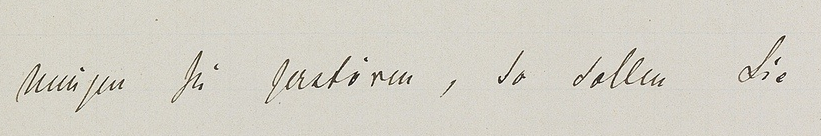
nungen zu zerstören, so sollen sie
